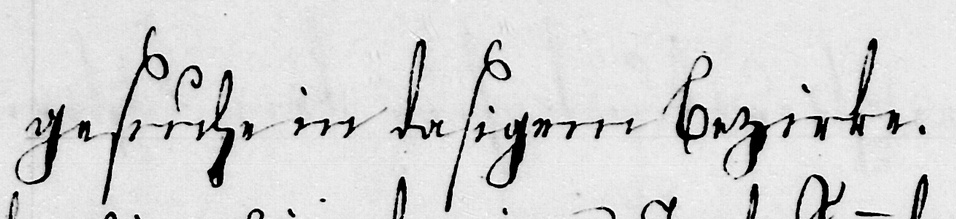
gesuche in dasigem Bezirke.
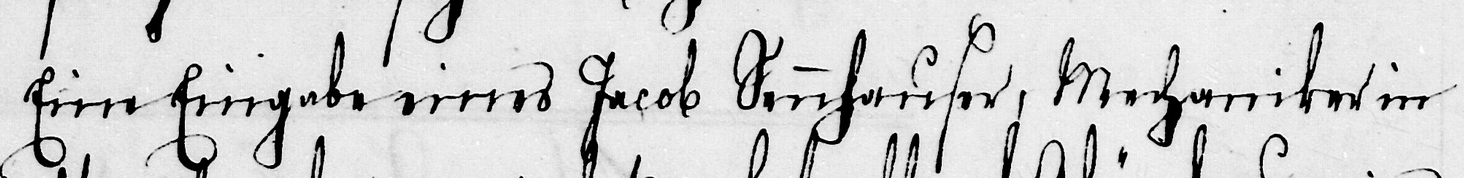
Eine Eingabe eines Jacob Sennhauser, Mechaniker in
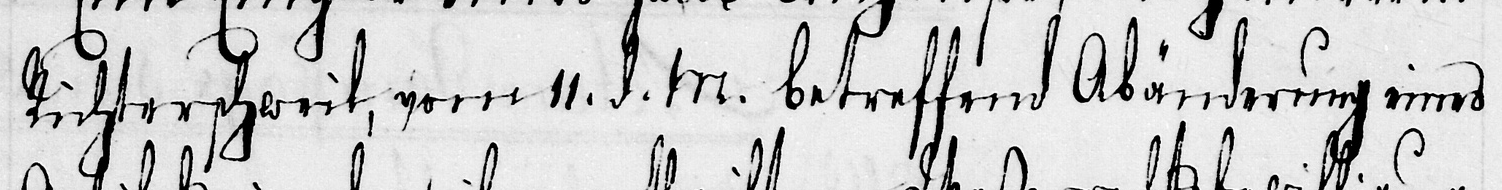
Richterschweil, vom 11. d. M. betreffend Abänderung eines
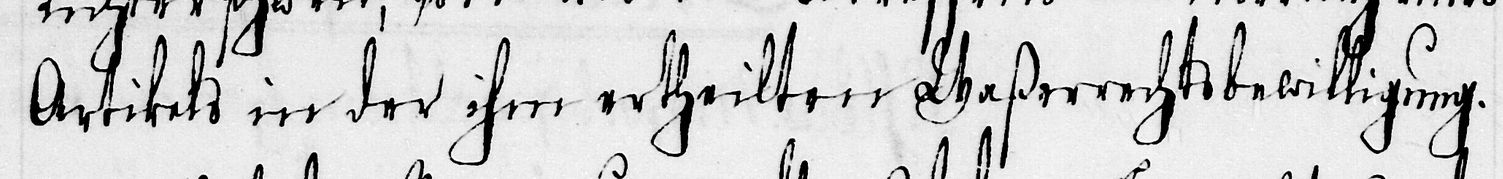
Artikels in der ihm ertheilten Waßerrechtsbewilligung.
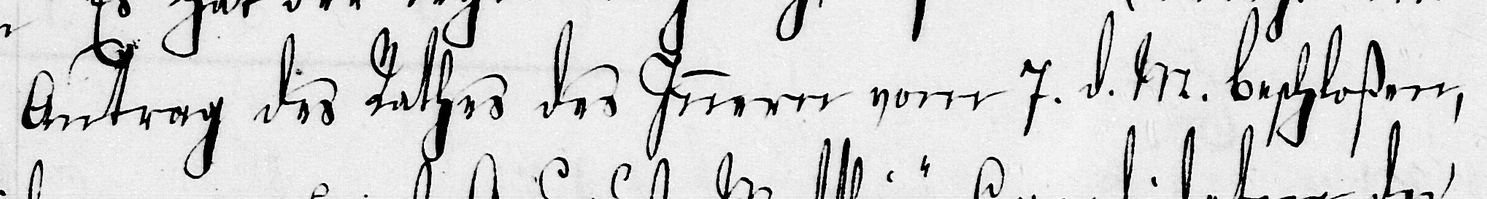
Antrag des Rathes des Innern vom 7. d. M. beschloßen,
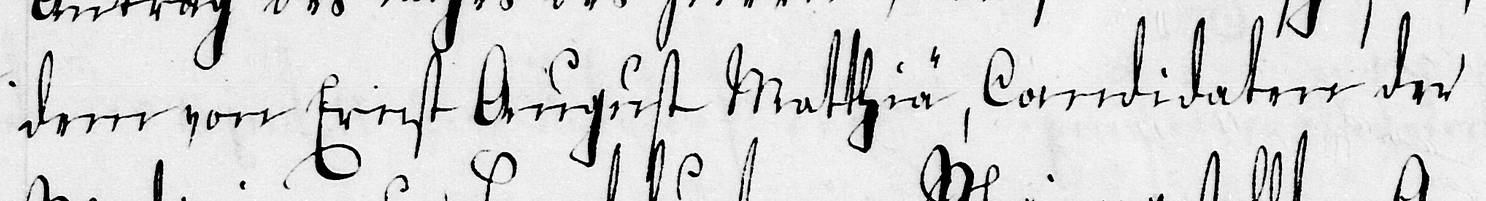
dem von Ernst August Matthiä, Candidaten der
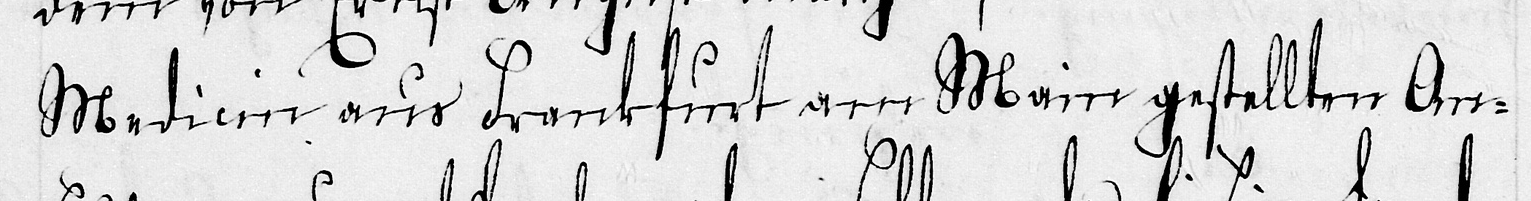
Medicin aus Frankfurt am Main gestellten An¬
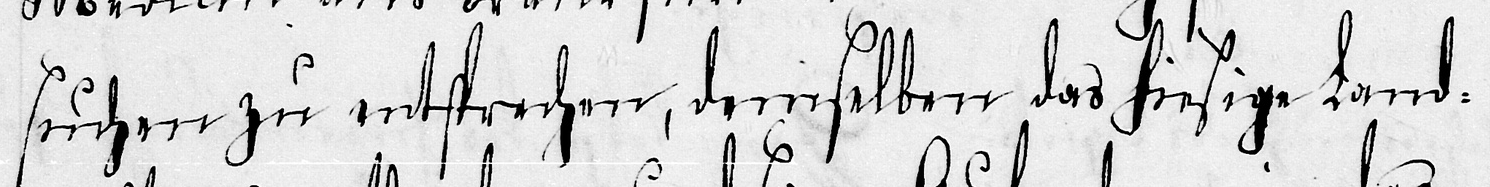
suchen zu entsprechen, demselben das hiesige Land¬
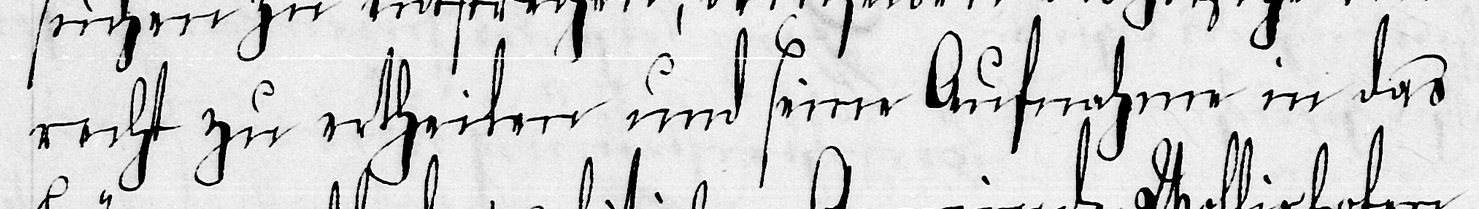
recht zu ertheilen und seine Aufnahme in das
